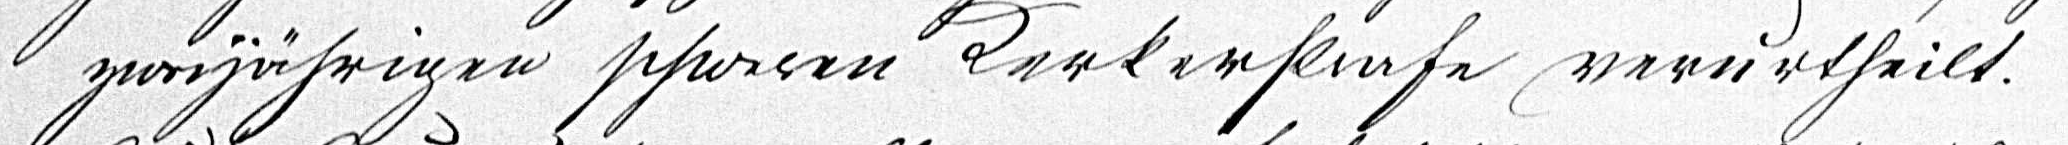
zweijährigen schweren Kerkerstrafe verurtheilt.
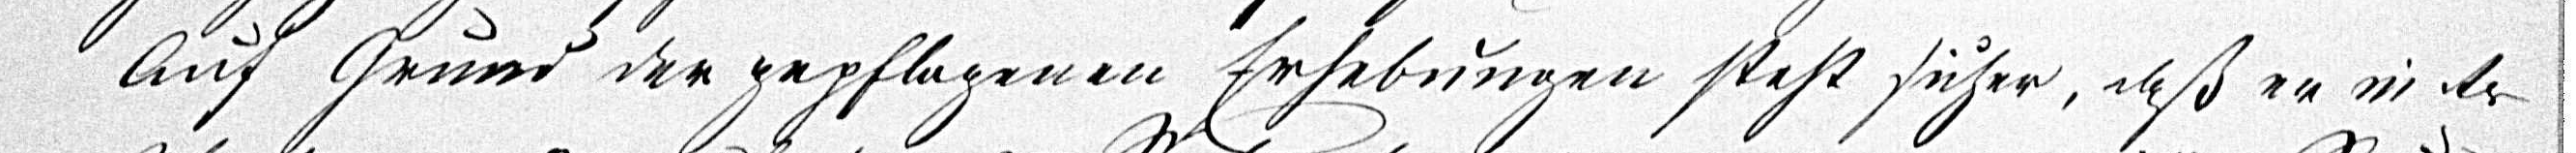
Auf Grund der gepflogenen Erhebungen steht sicher, daß er in der
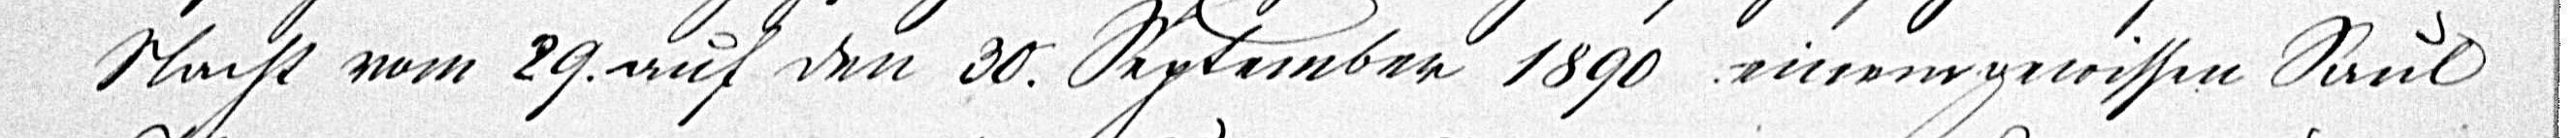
Nacht vom 29 auf den 30. September 1890 einem gewissen Saul
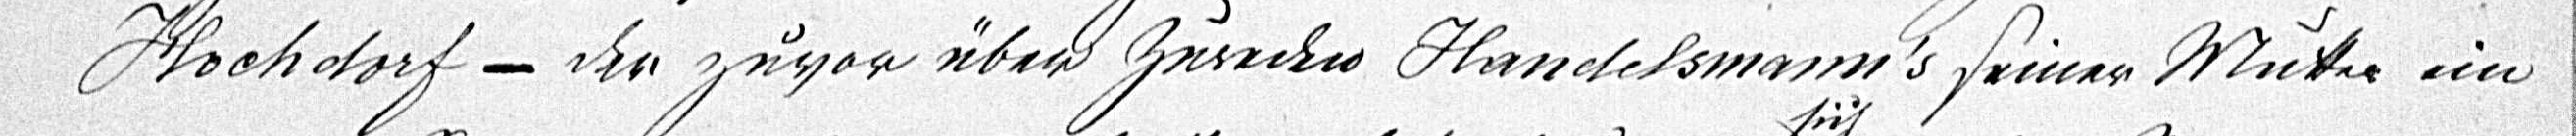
Hochdorf – der zuvor über Zurede? Handelsmann’s seiner Mutter ein
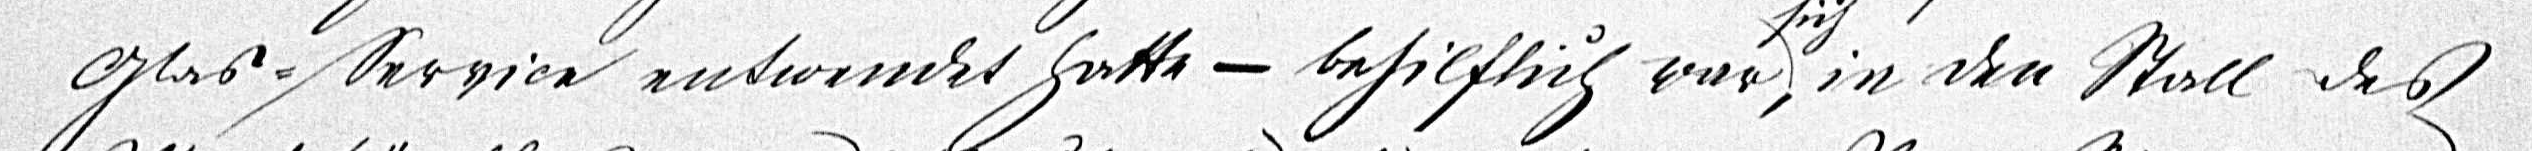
Glas- Service entwendet hatte – behilflich war, sich in den Stall des
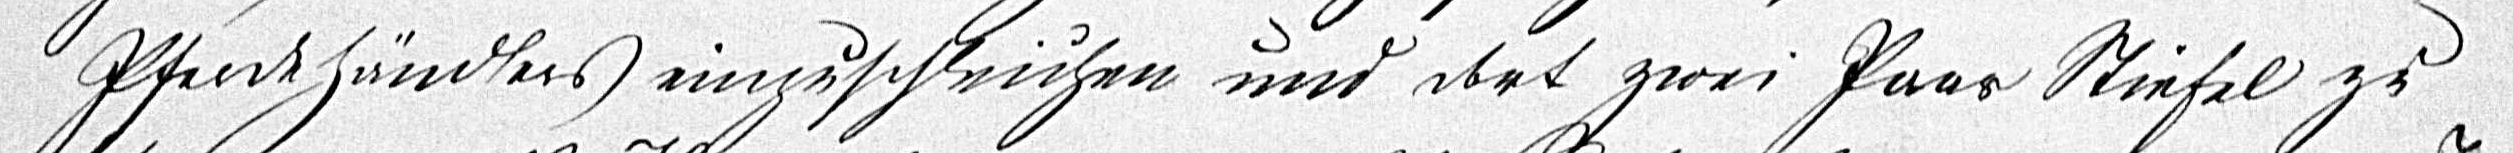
Pferdehändlers einzuschleichen und dort zwei Paar Stiefel zu
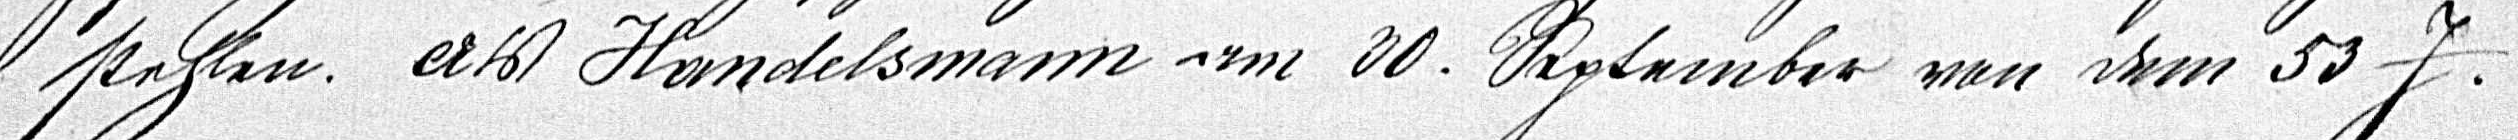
stehlen. Als Handelsmann am 30. September von dem 53 J.
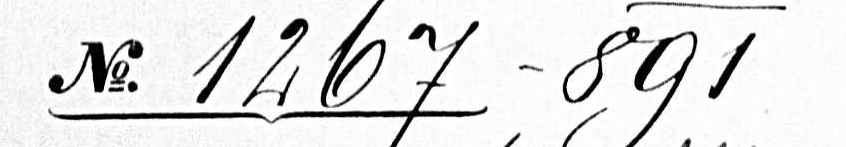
No. 1267 – 1891
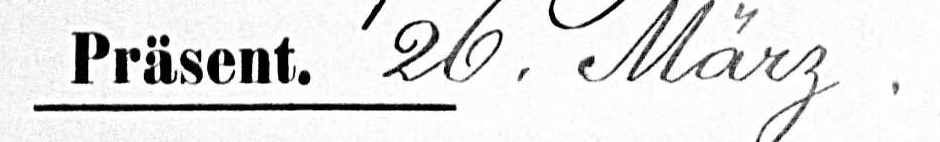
Präsent. 26. März
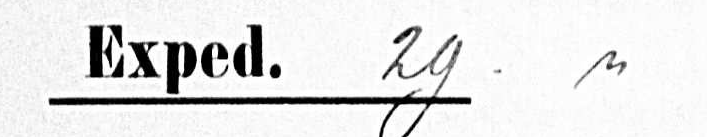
Expedit 29. „
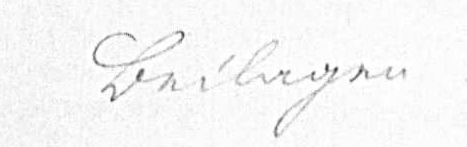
Beilagen
